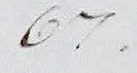67
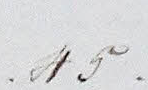45
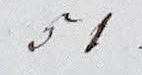51
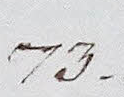73
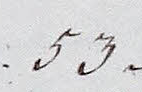53
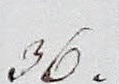36
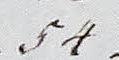54
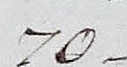70
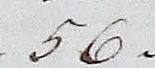56
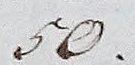50
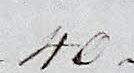40
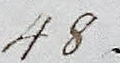48
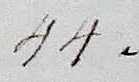44
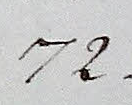72
